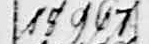15967
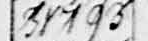31793
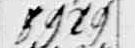5929
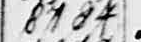8764
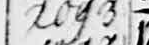2093
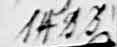1433
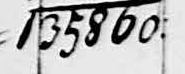135860
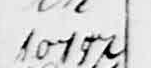10152
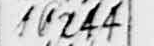16244
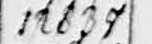12839
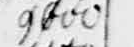9600
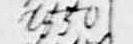2550
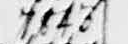7843
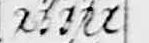23322
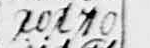20270
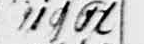11962
